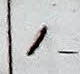1
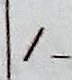1
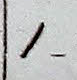1
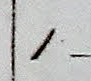1
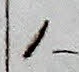1
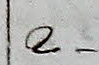2
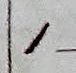1
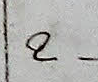2
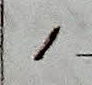1
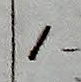1
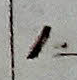1
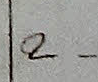2
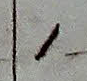1
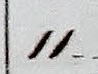11
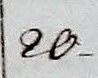20
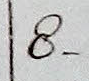8
